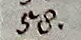58
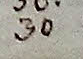30
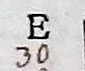30
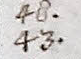43
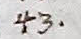43
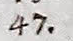47
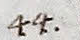44
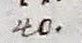40
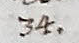34
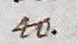40
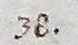38
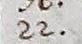22
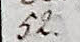52
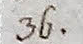36
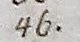46
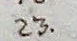23
